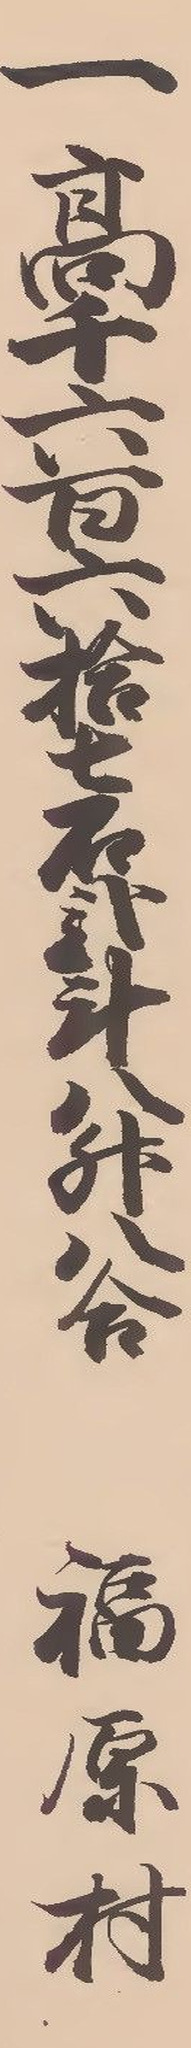一高千六百六拾七石弐斗八升八合福原村
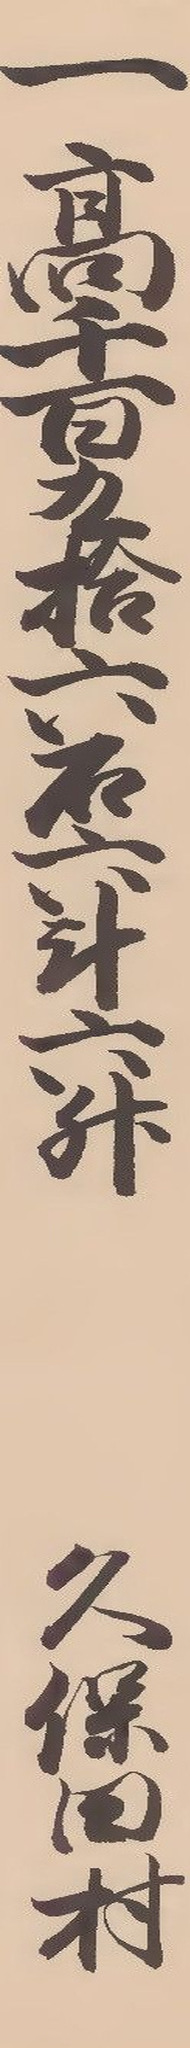一高千百九拾六石六斗六升久保田村
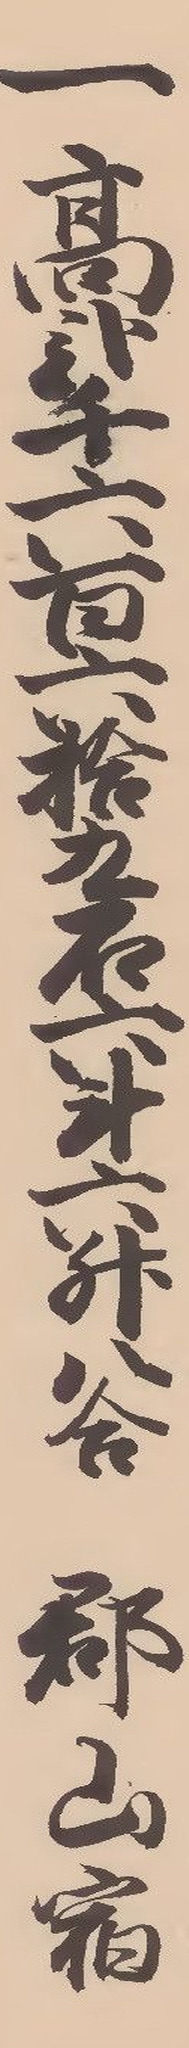一高弐千六百六拾九石六斗六升八合郡山宿
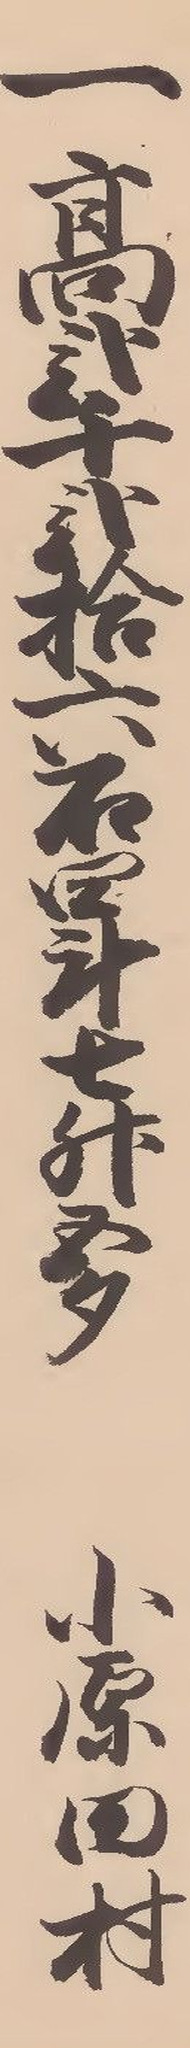一高弐千弐拾六石四斗七升五勺小原田村

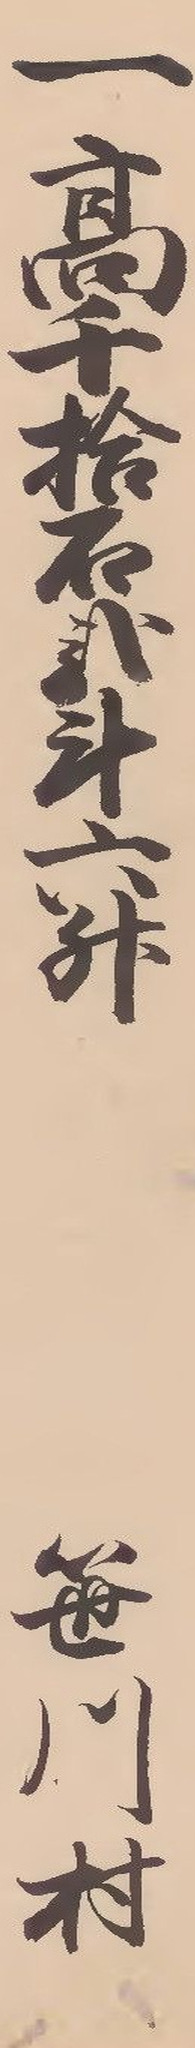一高千拾石弐斗六升笹川村
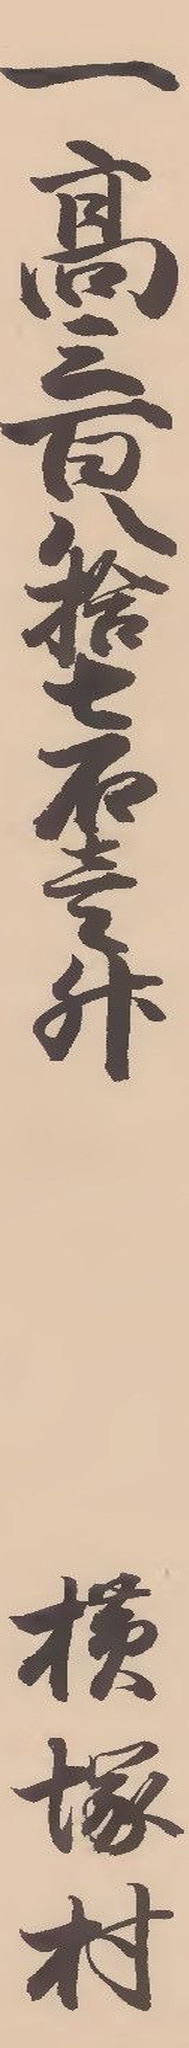一高三百八拾七石壱升横塚村
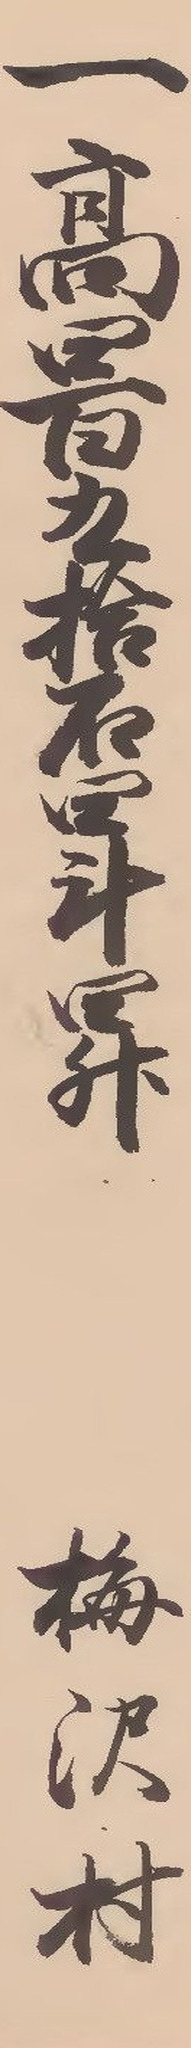一高四百九拾石四斗四升梅沢村
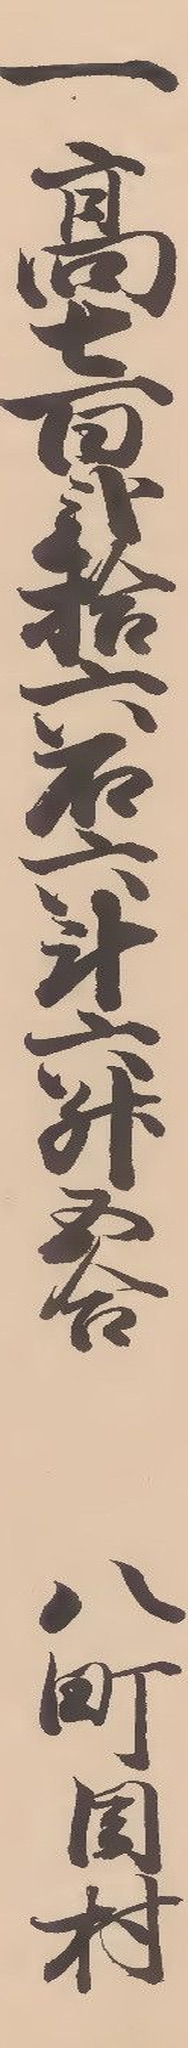一高七百弐拾六石六斗六升五合八町目村
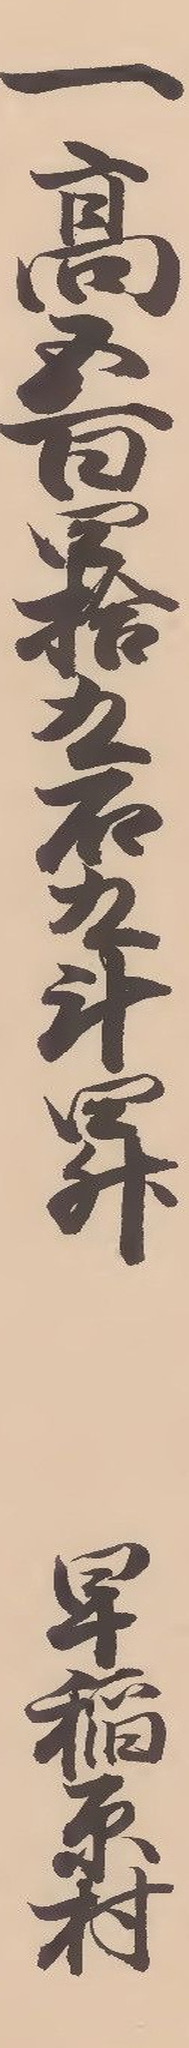一高五百四拾九石九斗四升早稲原村
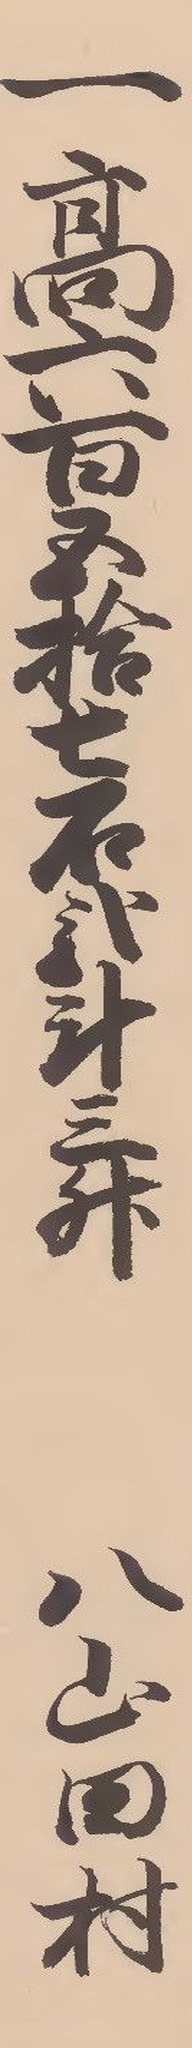一高六百五拾七石弐斗三升八山田村
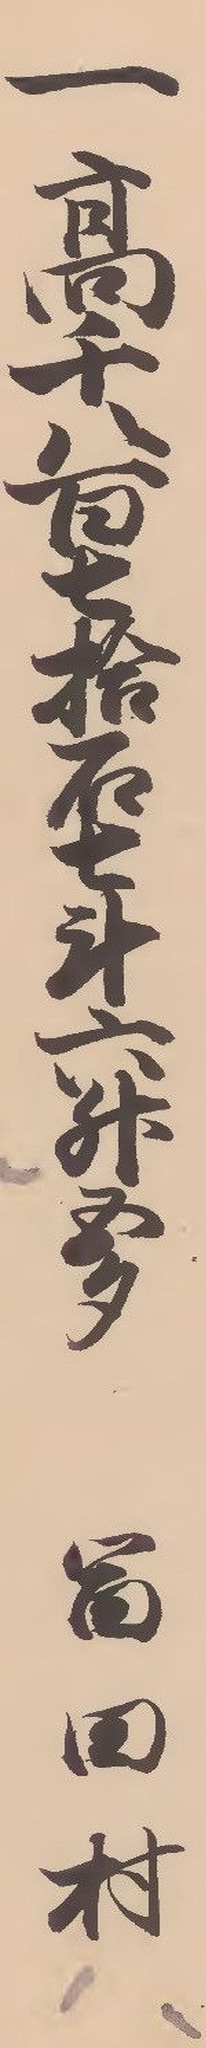一高千八百七拾石七斗六升五勺富田村

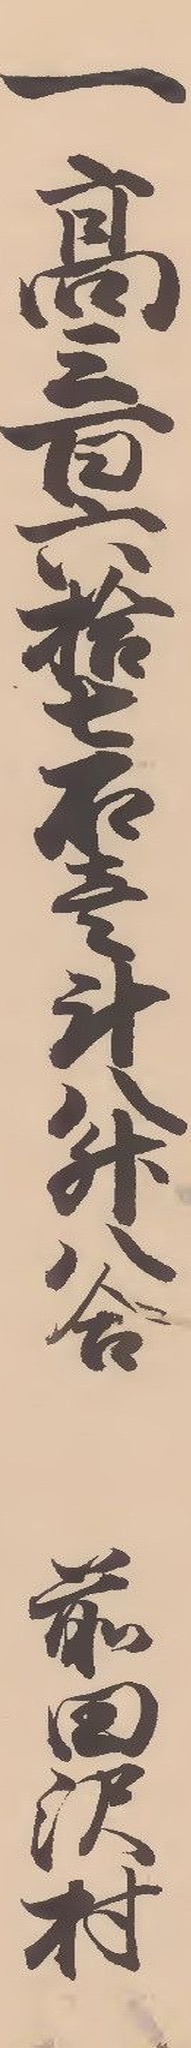一高三百六拾七石壱斗八升八合前田沢村
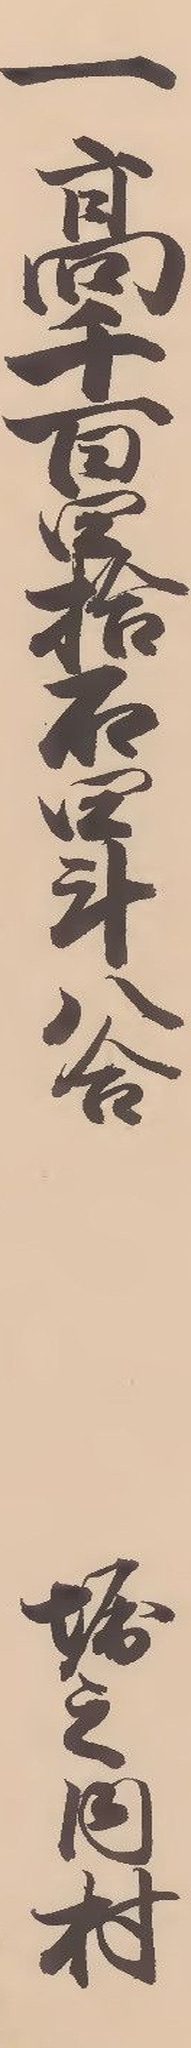一高千百四拾石四斗八合堀之内村
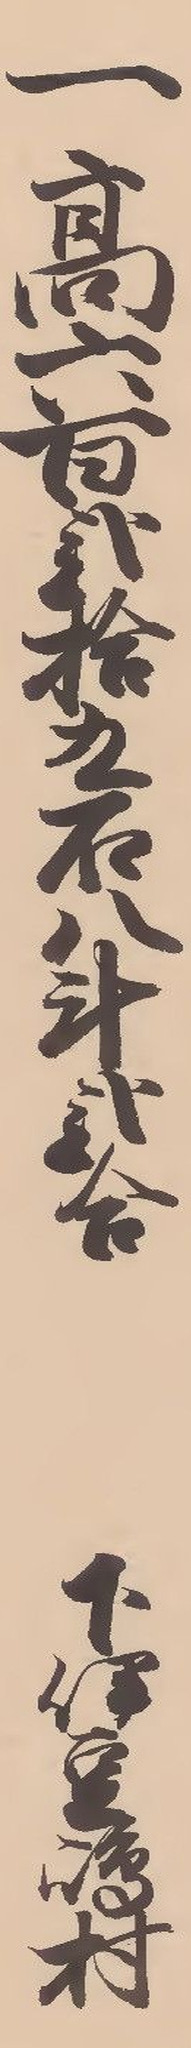一高六百弐拾九石八斗弐合下伊豆島村
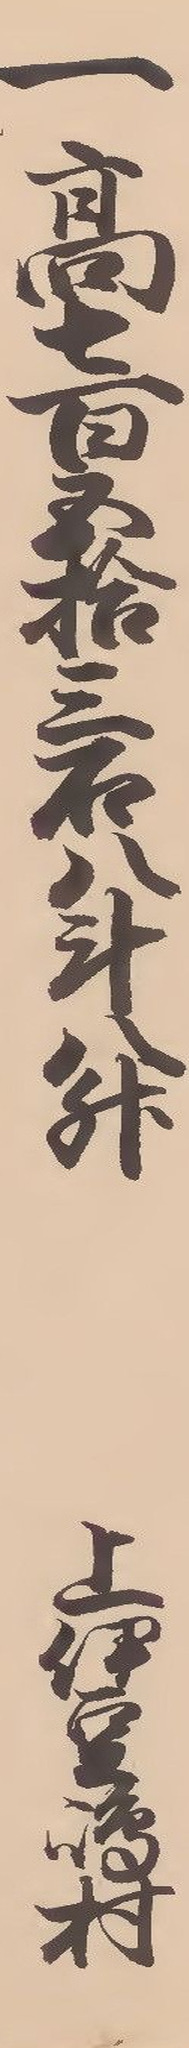一高七百五拾三石八斗八升上伊豆島村
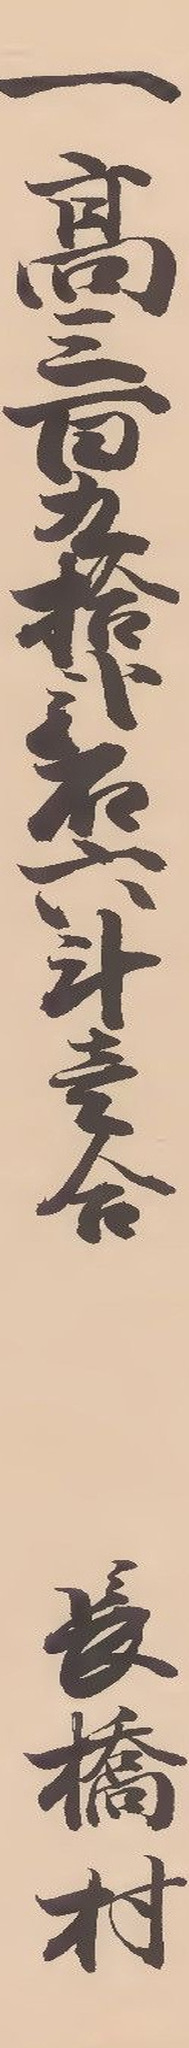一高三百九拾弐名六斗壱合長橋村
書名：陸奥国郷帳　２
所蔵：国立公文書館 National Archives of Japan
